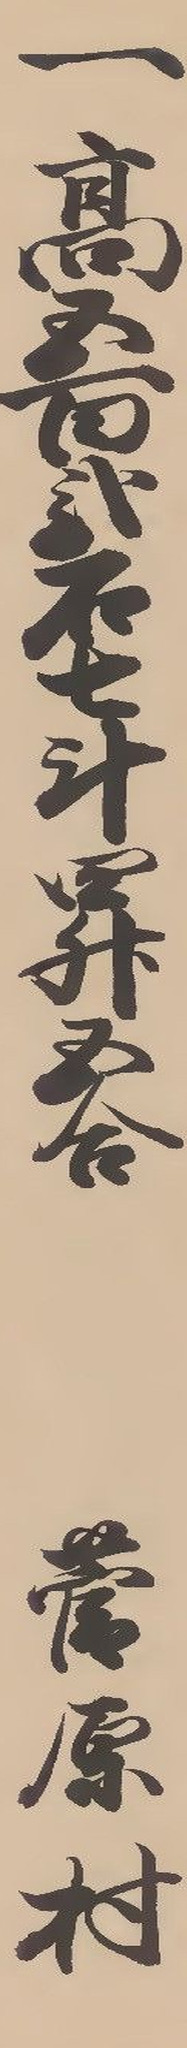一高五百弐石七斗四升五合菅原村
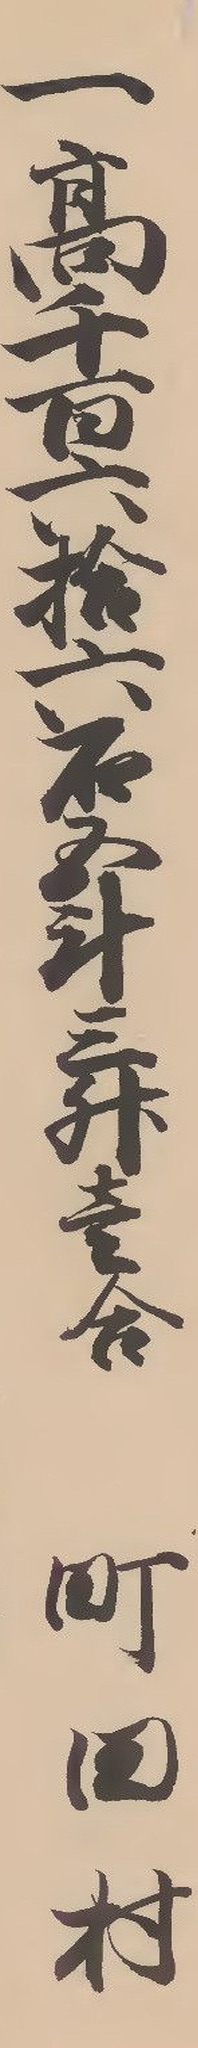一高千百六拾六石五斗三升壱合町田村
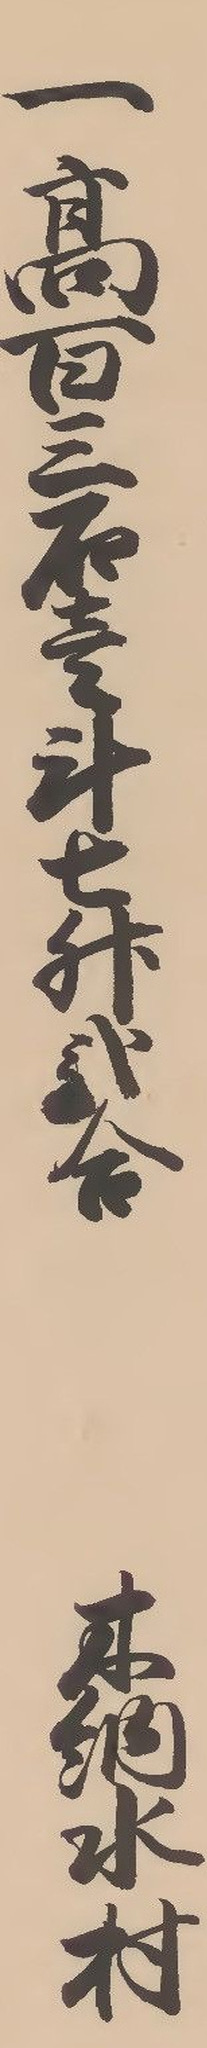一高百三石壱斗七升弐合木納水村
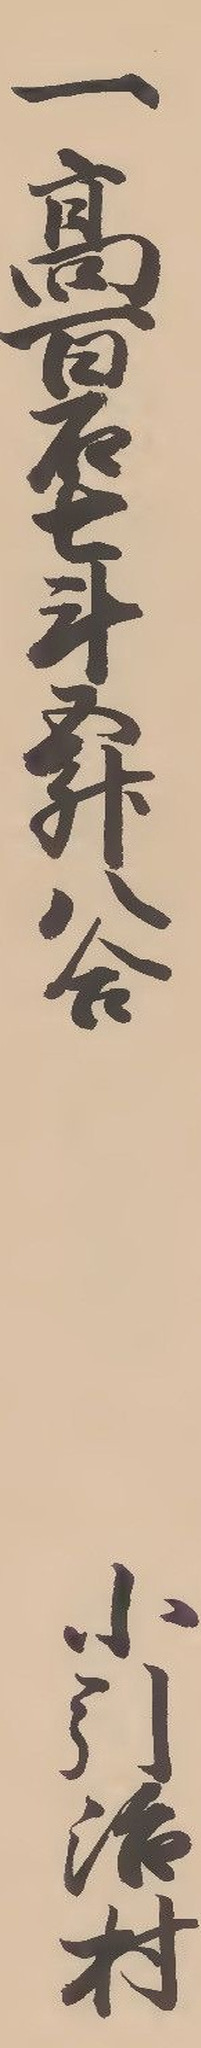一高百石七斗五升八合小引治村

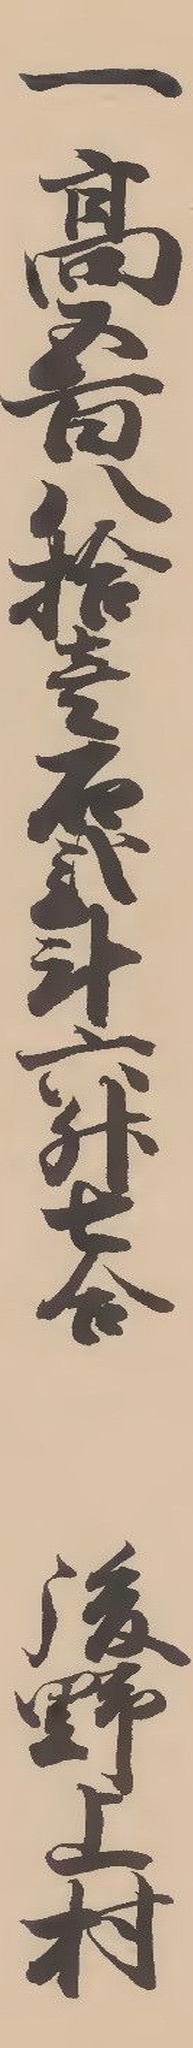一高五百八拾壱石弐斗六升七合後野上村
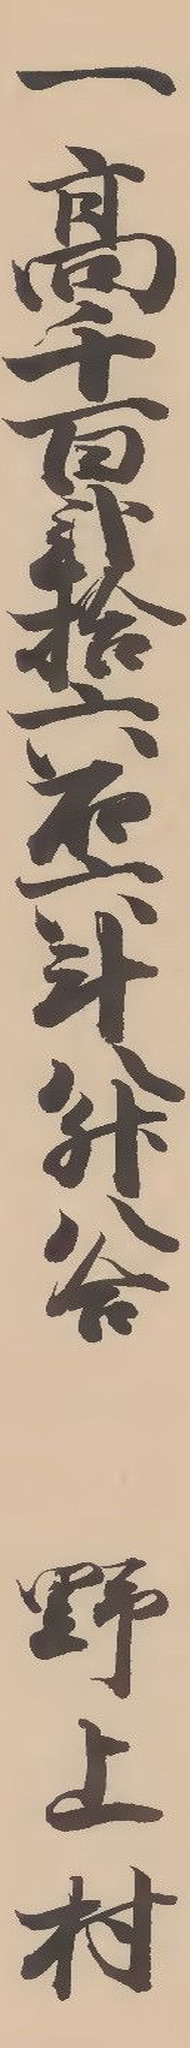一高千百弐拾六石六斗八升八合野上村
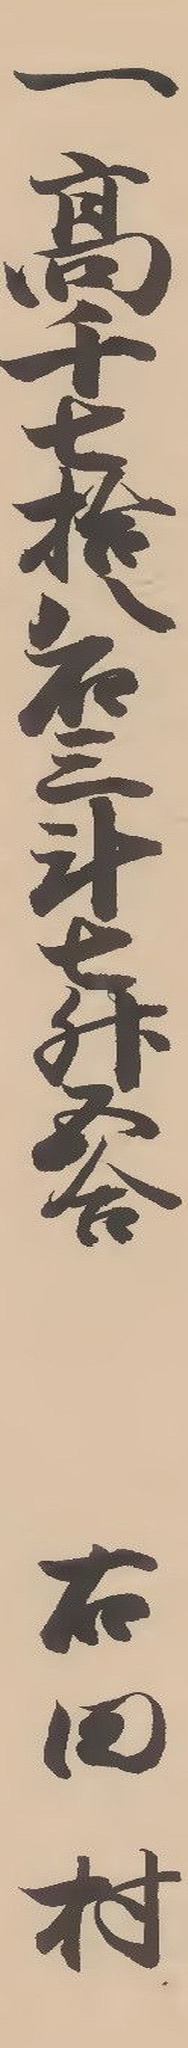一高千七拾八石三斗七升五合右田村
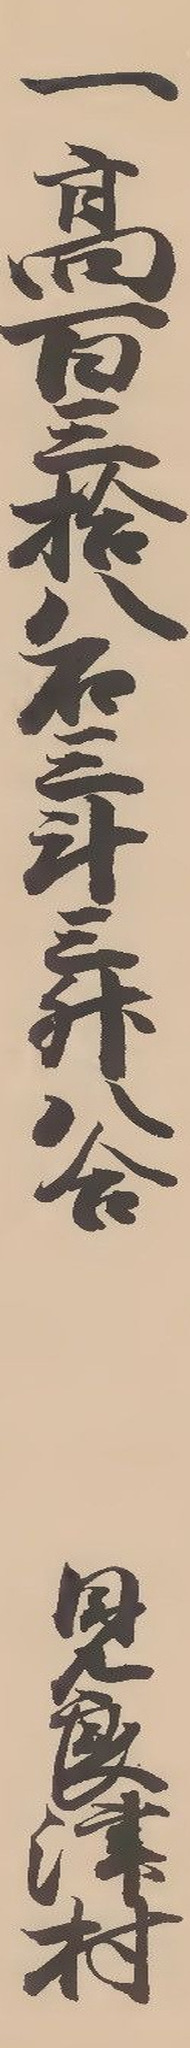一高百三拾八石三斗三升八合見良津村
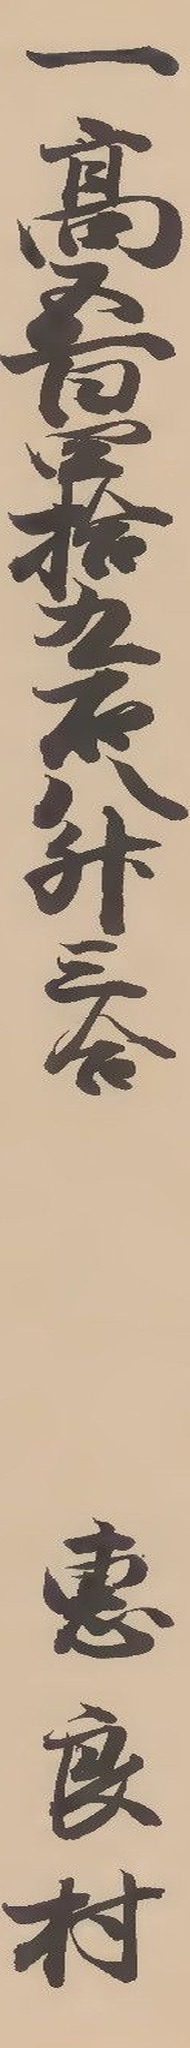一高五百四拾九石八升三合恵良村
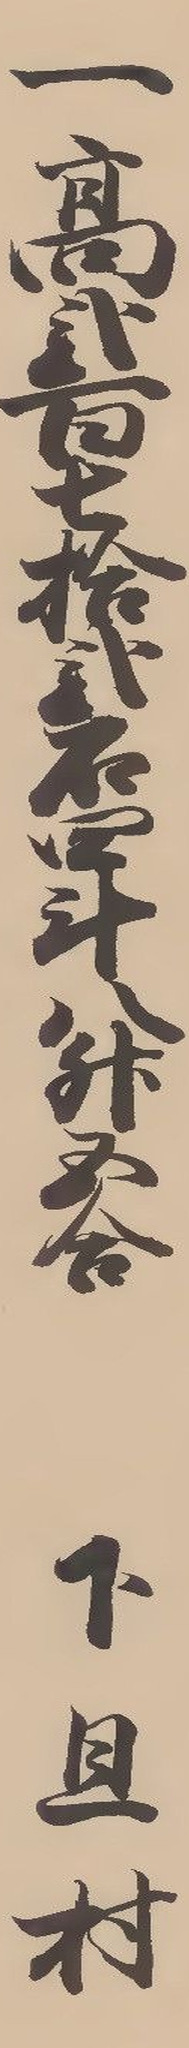一高弐百七拾弐石四斗八升五合下旦村
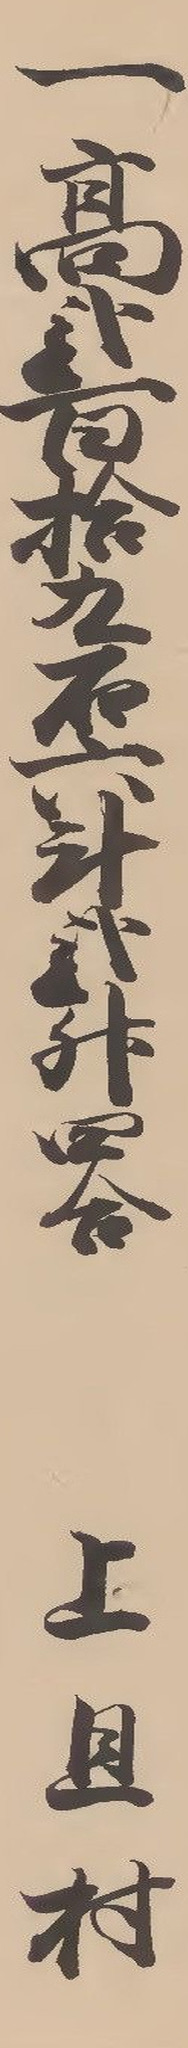一高弐百拾九石六斗弐升四合上旦村
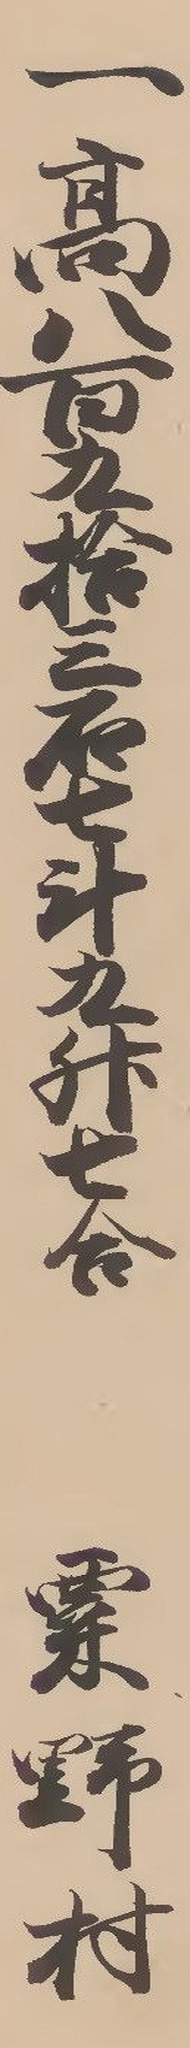一高八百九拾三石七斗九升七合粟野村

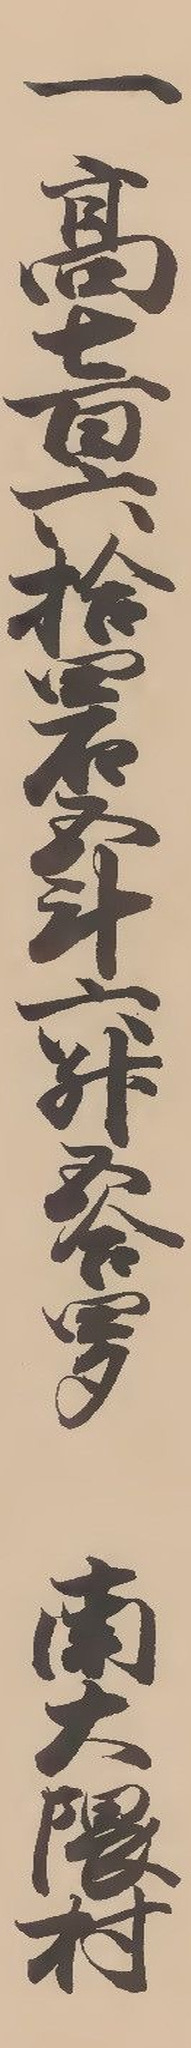一高七百六拾四石五斗六升五合四勺南大隈村
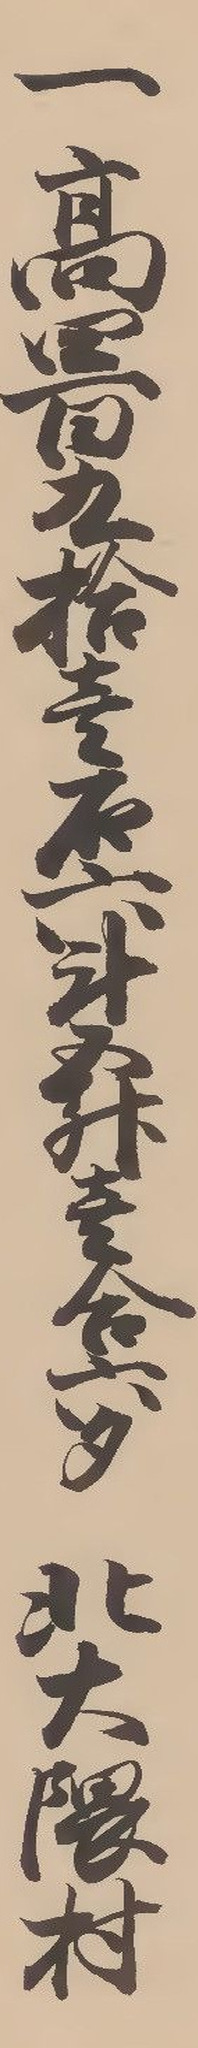一高四百九拾壱石六斗五升壱合六勺北大隈村
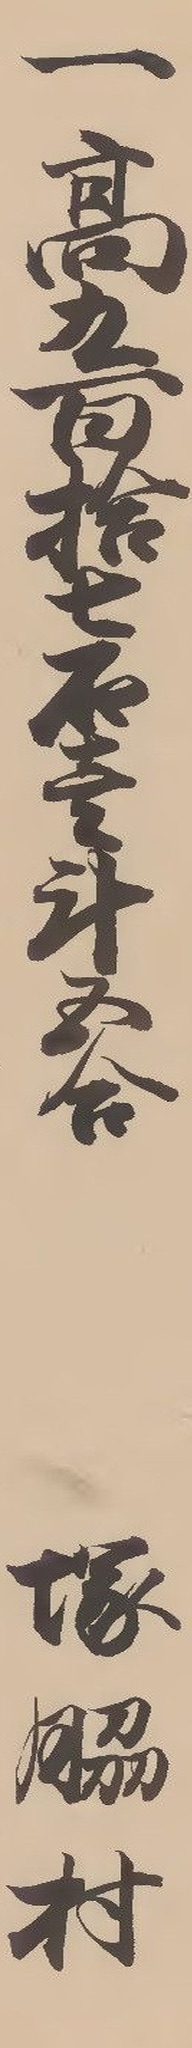一高九百拾七石壱斗五合塚脇村
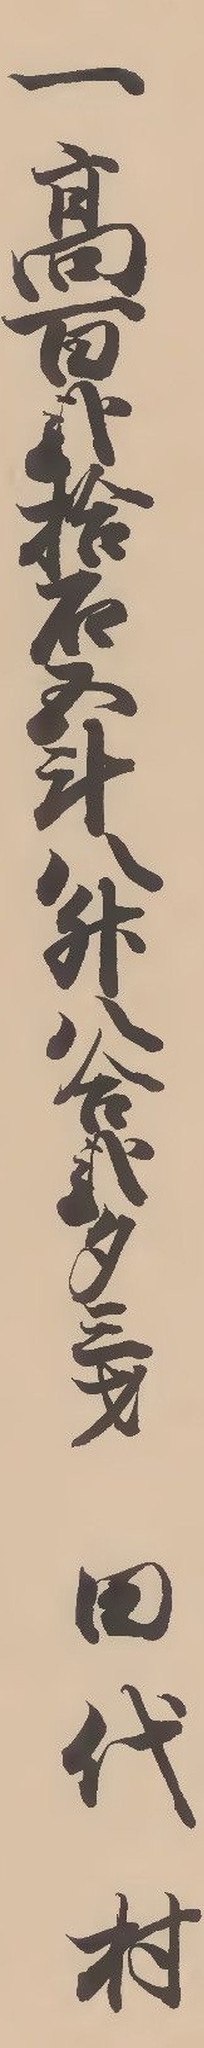一高百弐拾石五斗八升八合弐勺三才田代村
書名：豊後国郷帳
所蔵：国立公文書館 National Archives of Japan
